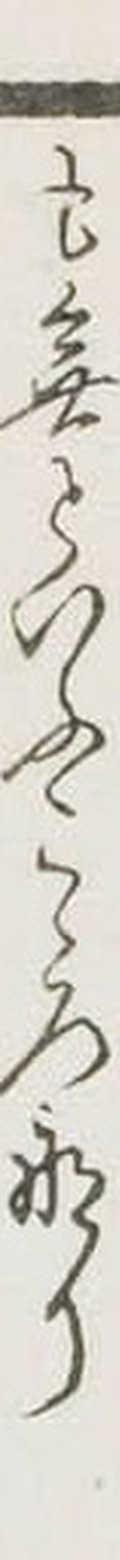も無といふこゝろなり
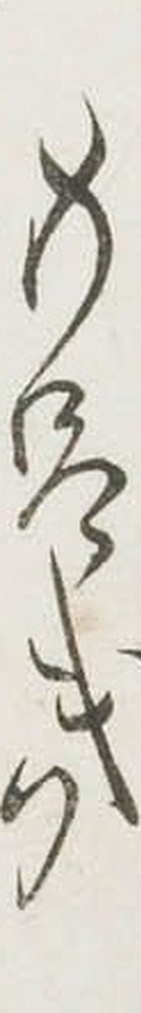もろき
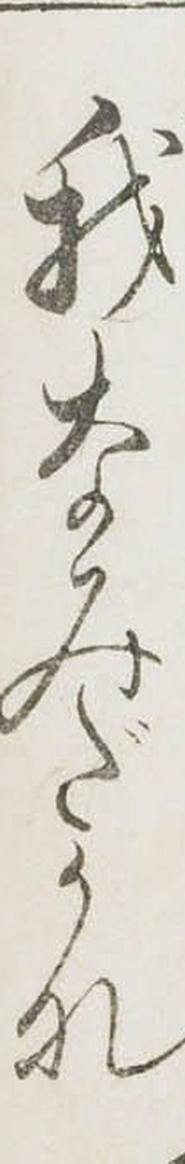我なみだかな
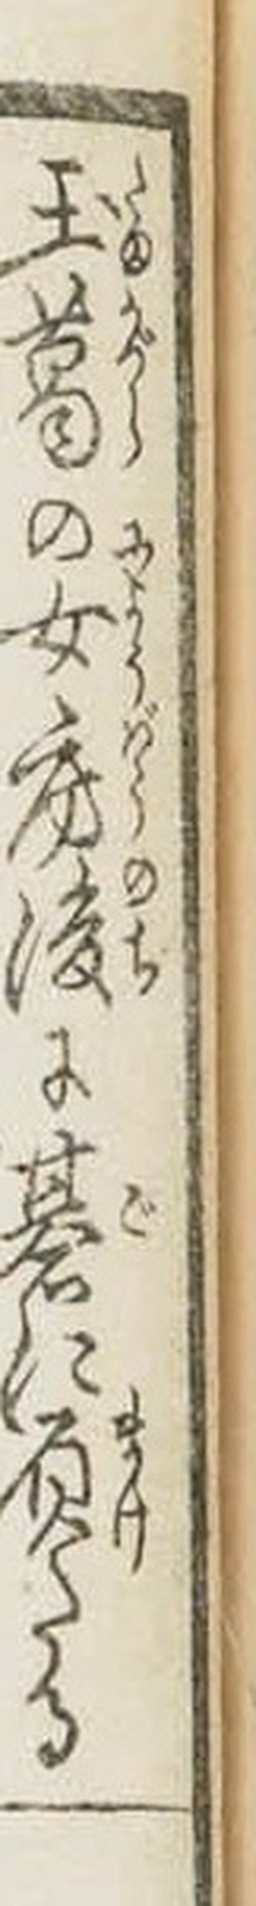玉葛の女房後に碁に負たる
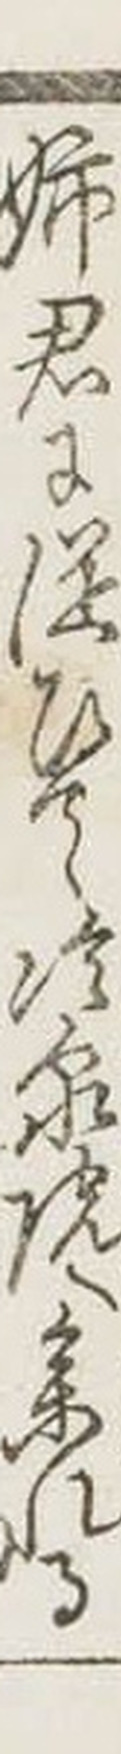姉君に従ひて冷泉院へ参れる
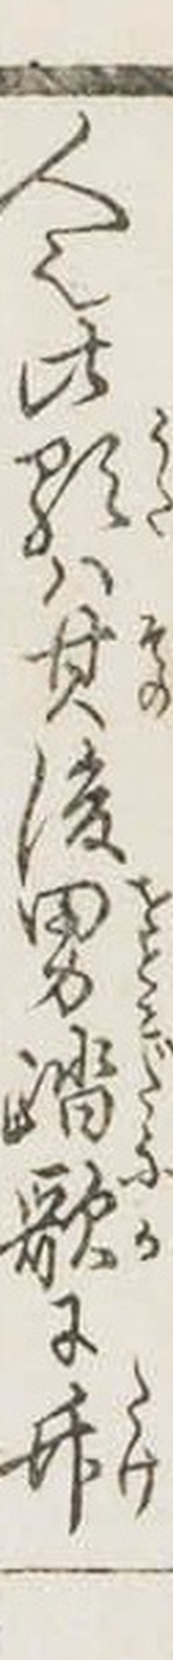人也此歌は其後男踏歌に竹
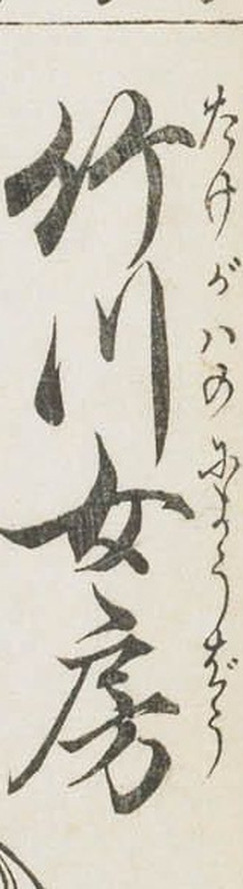竹川女房
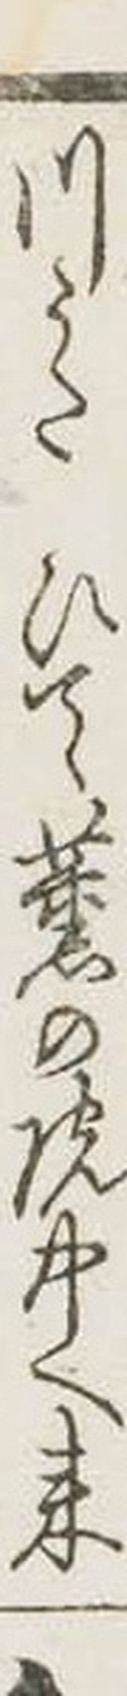川うたひて薫の院中へ来
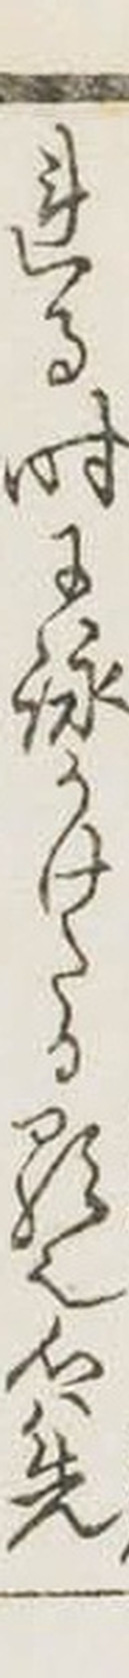れる時に詠かけたる歌也心は先
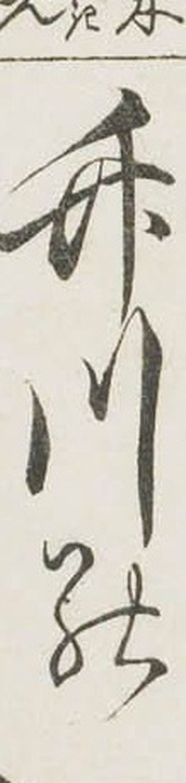竹川の
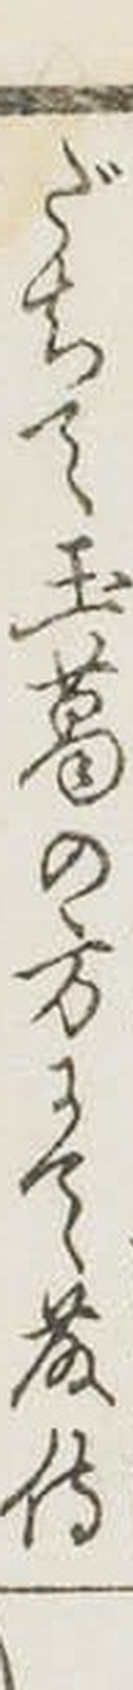だちて玉葛の方にて藤侍
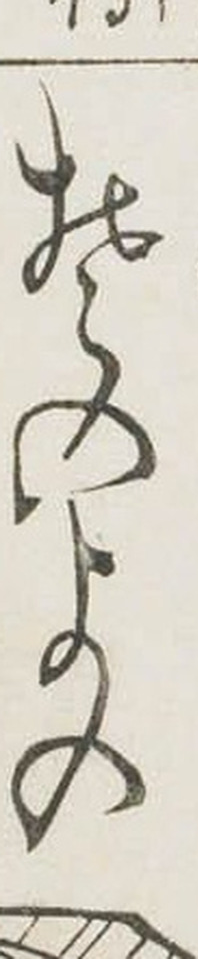そのよの
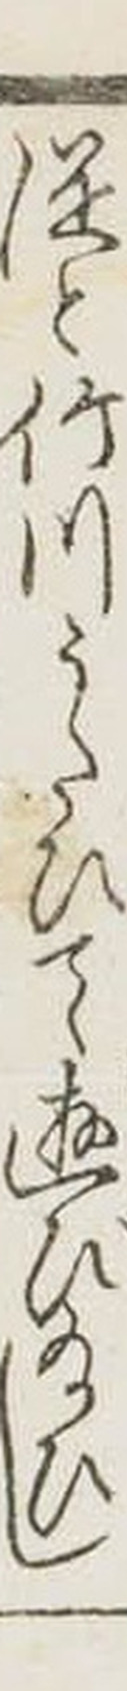従と竹川うたひて遊び給ひし
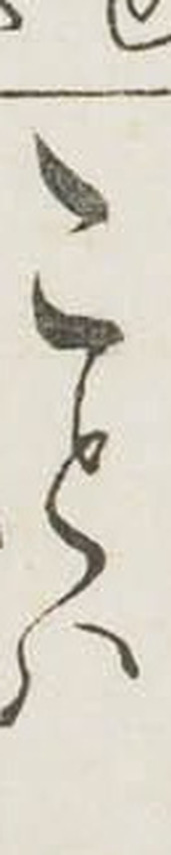ことは
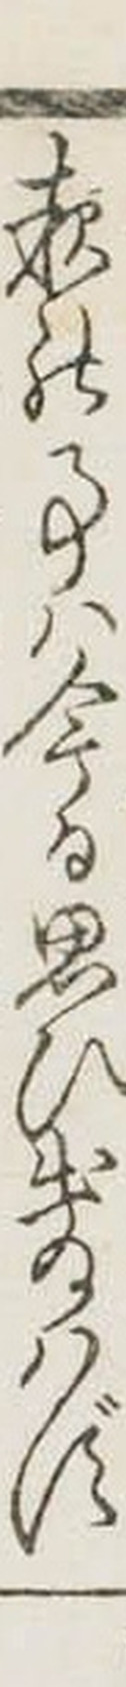夜の事は今日思ひ出給はず
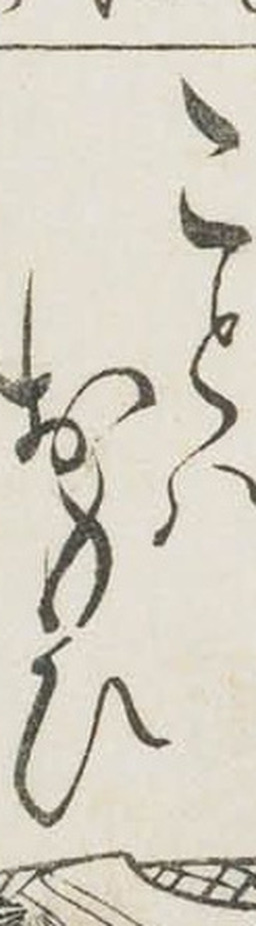おもひ
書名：源氏百人一首
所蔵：東京学芸大学教育コンテンツアーカイブ
